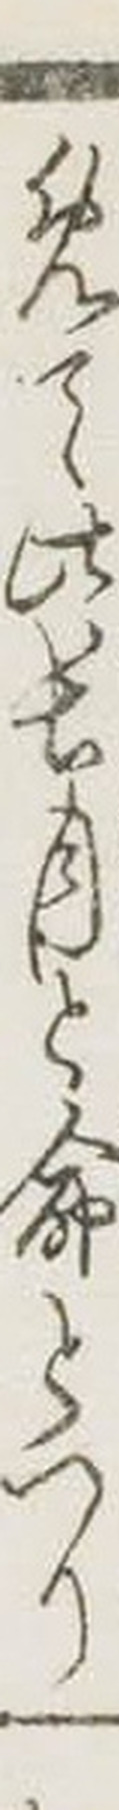めて此長月と命とつり
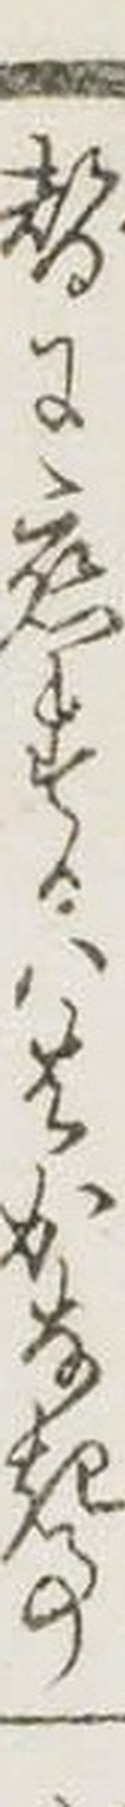替に恋するははかなき事
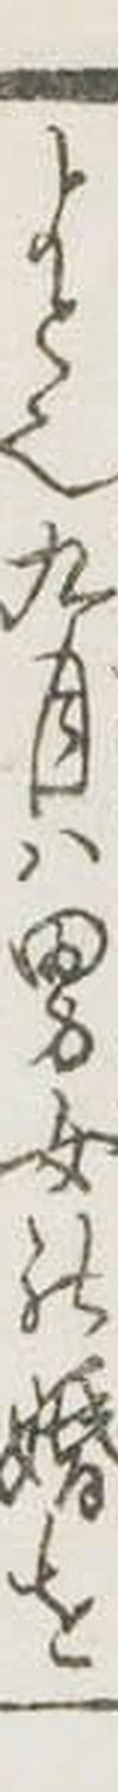よと也九月は男女の婚を
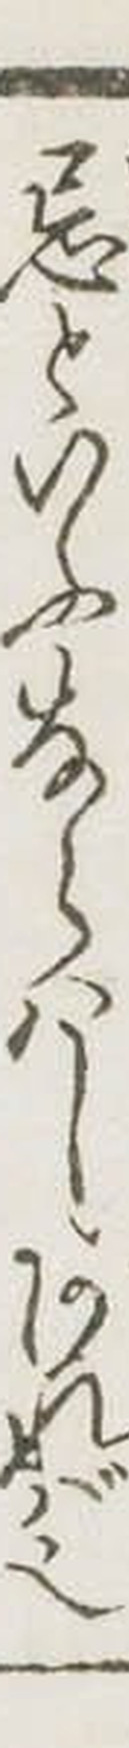忌といふならはしあれば也
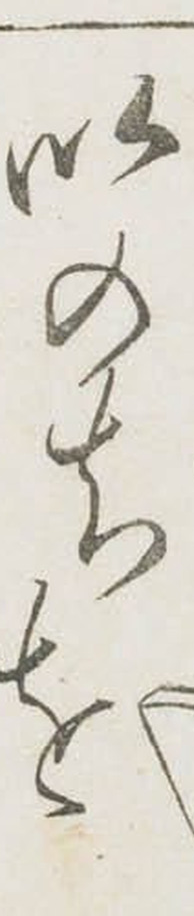いのちを
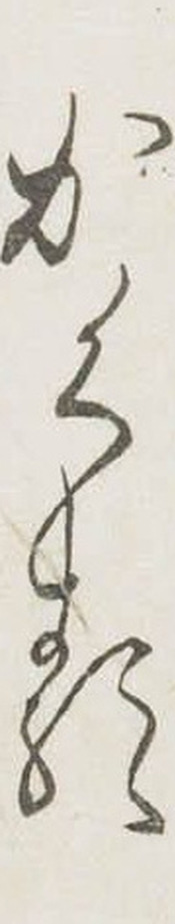かくる
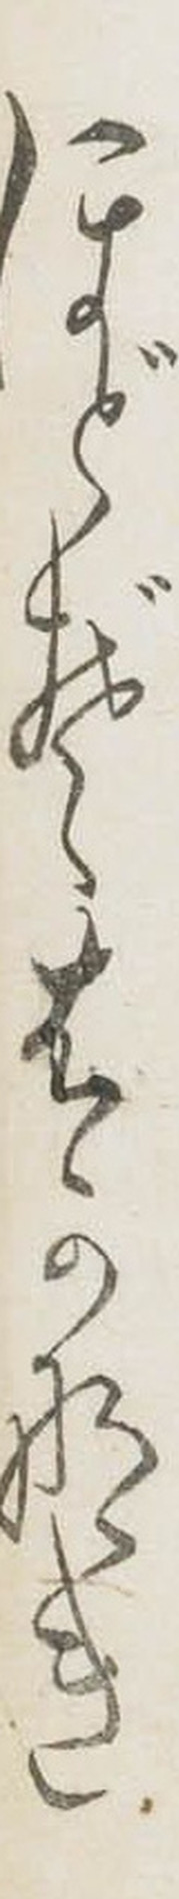ほどぞはかなき
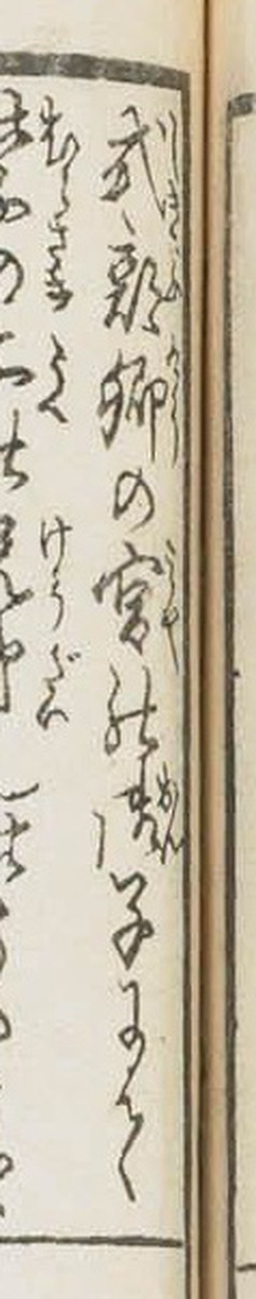式部卿の宮の御子にて
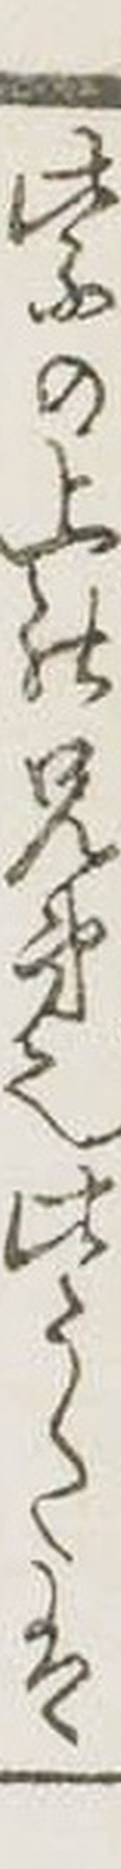紫の上の兄弟也此うたは
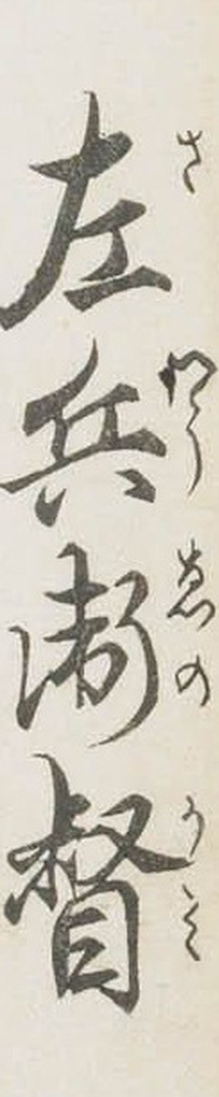左兵衛督
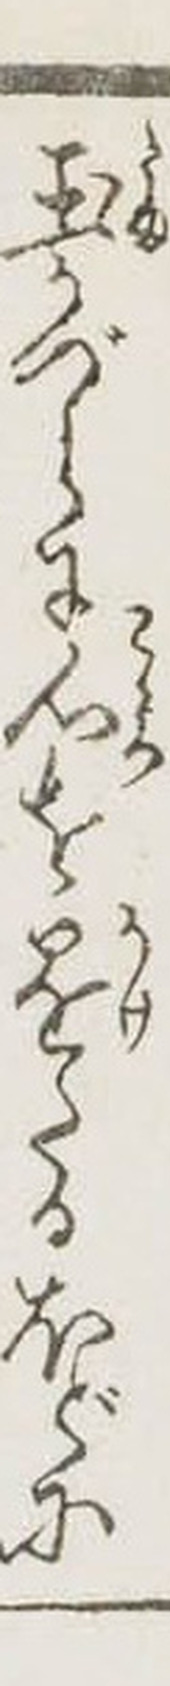玉かづらに心を懸たるほどに
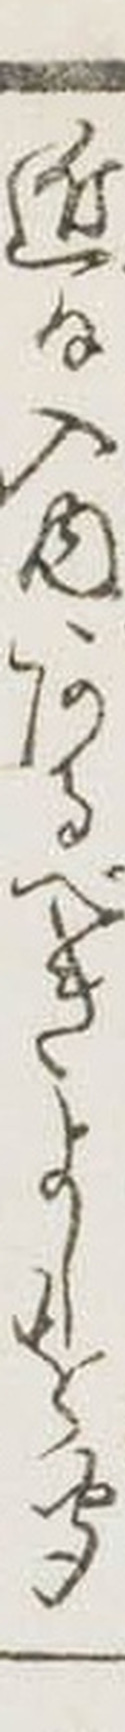近日入内あるべきよしを聞
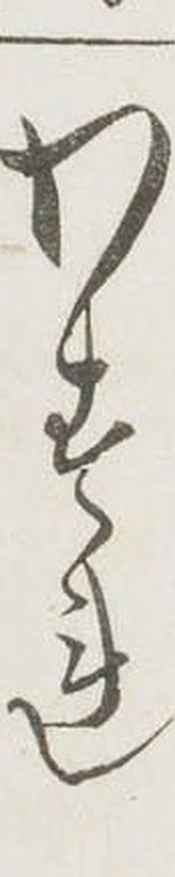わすれ
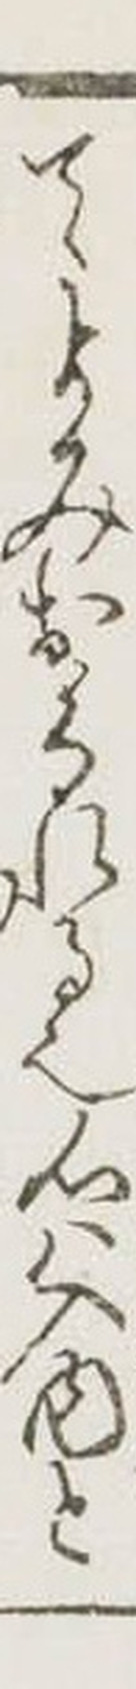てよみおくれる也心は入内と
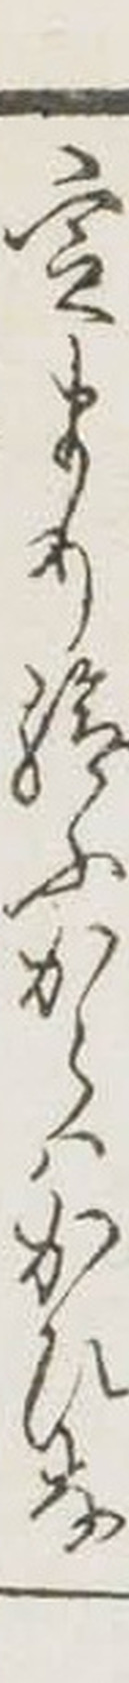定まり給ふからはかひな
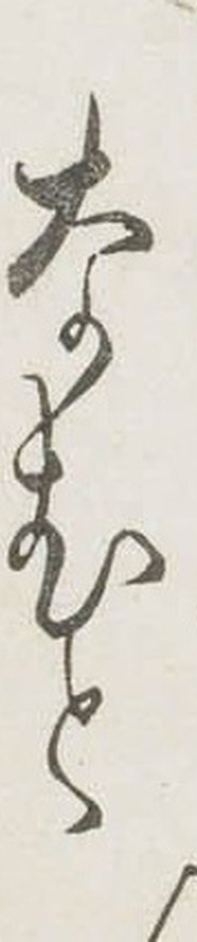なむと
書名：源氏百人一首
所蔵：東京学芸大学教育コンテンツアーカイブ
